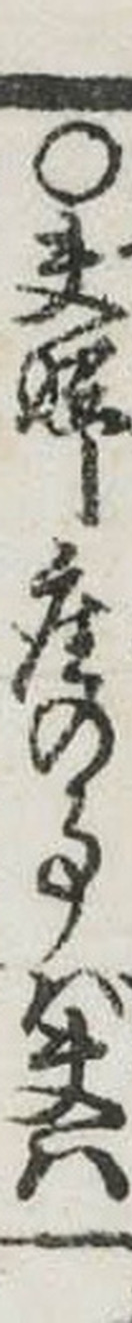○夫婦座の事は夫は
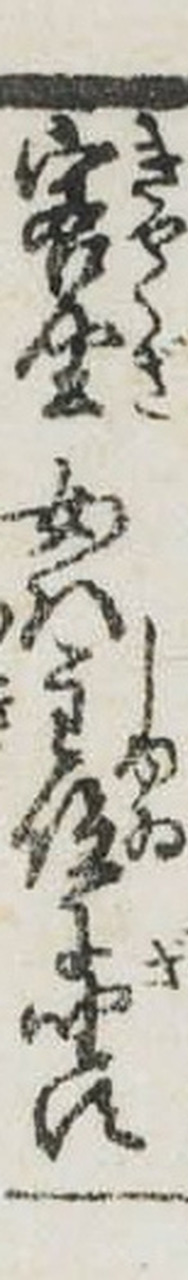客座女は主位に座す
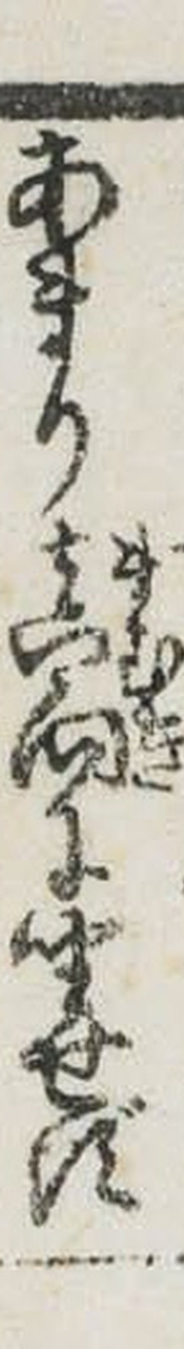あまり真向に座せず
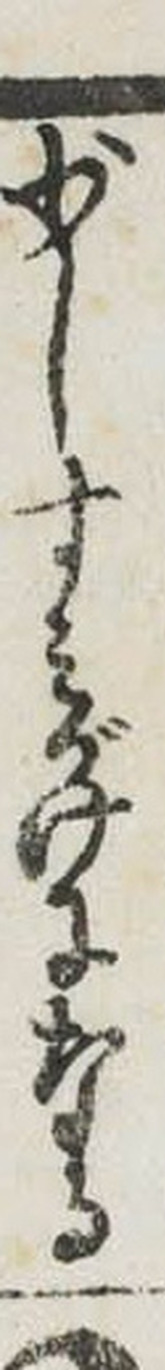少しすみがけになる
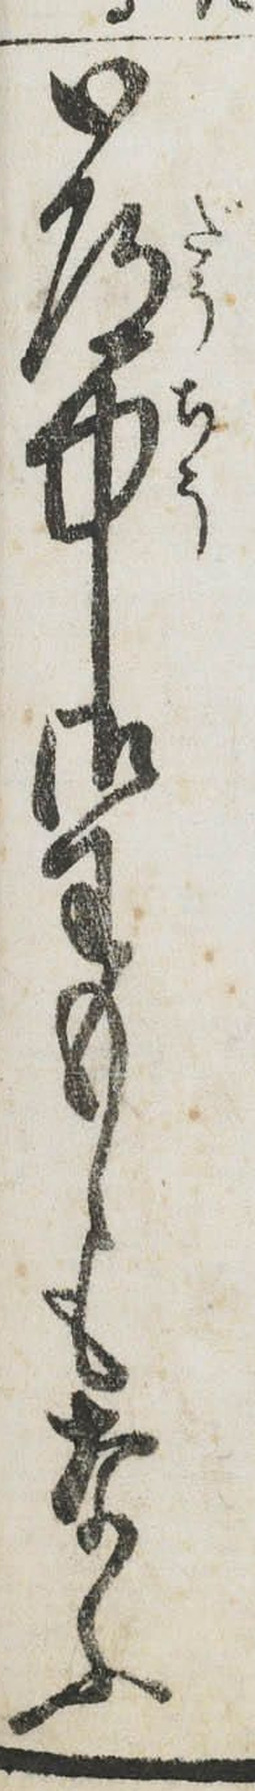御道中御わもしもなふ
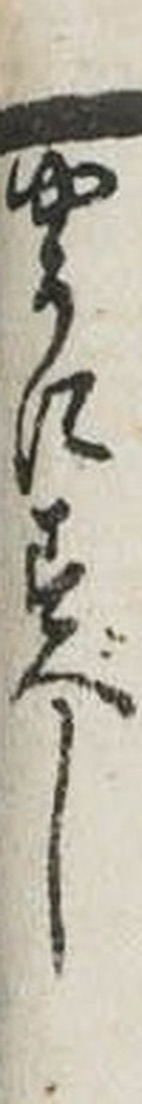やうにすべし
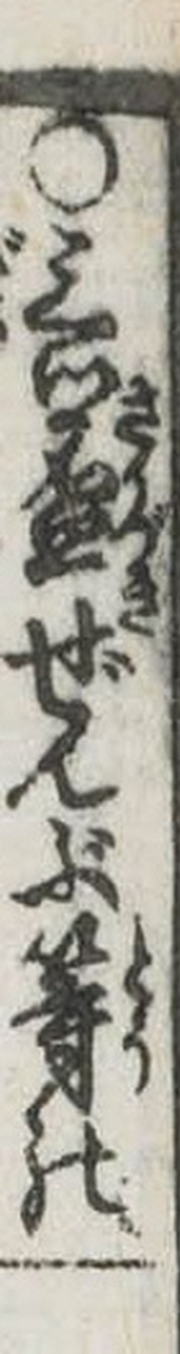○三ツ盃ぜんぶ等の
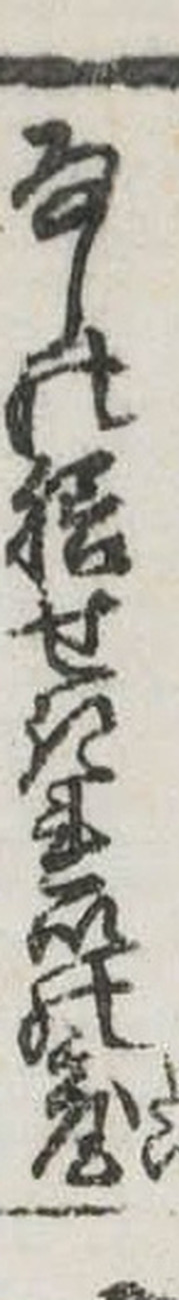なしの膳せきれいの台
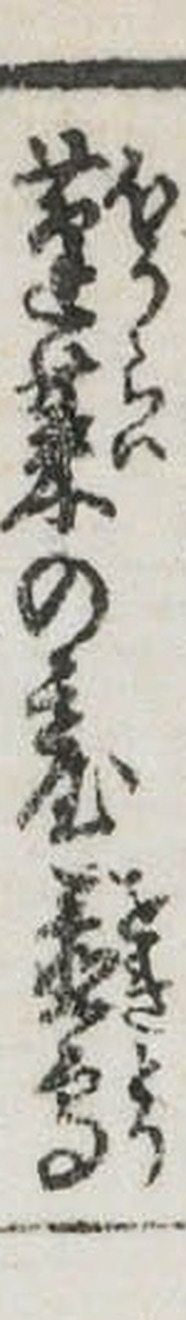蓬莱の台置鳥
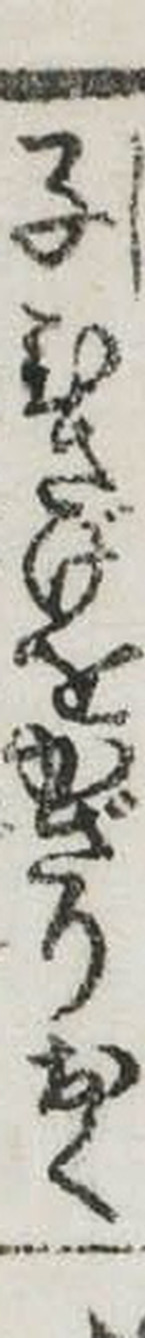子ひさげをかざりおく
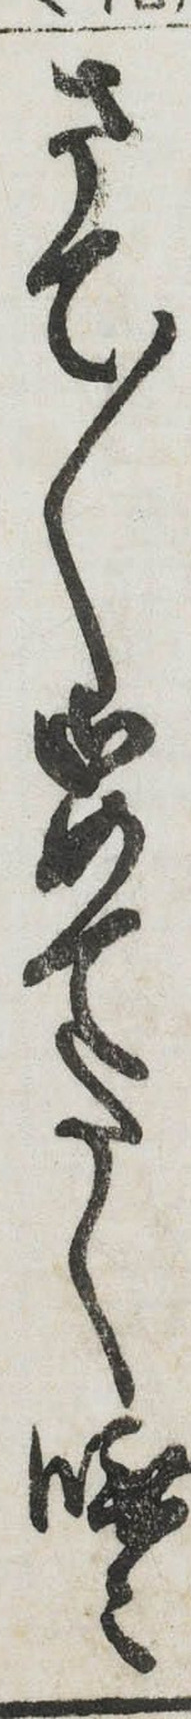さて〳〵御めてたく嘸々
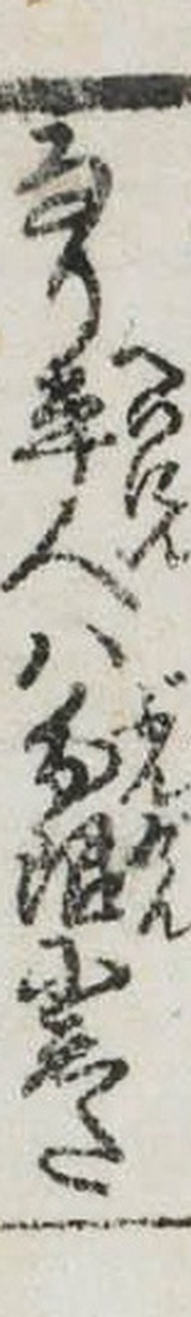なり平人は分限にした
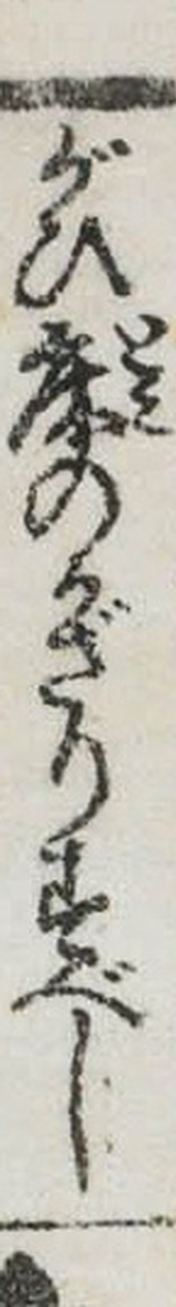がひ床のかざりすべし
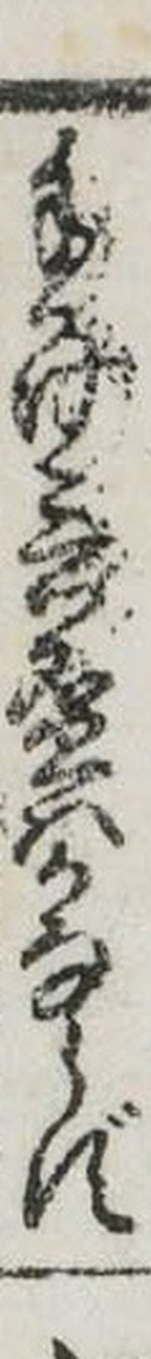てかけ三ツ盃はかならず
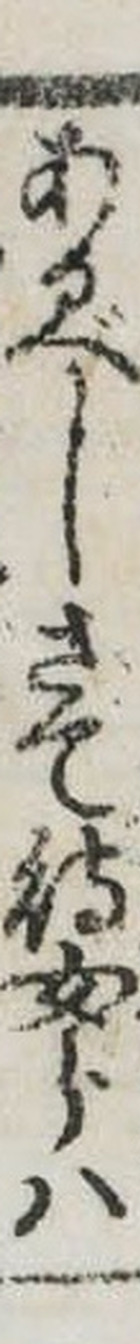あるべしさて待女郎は
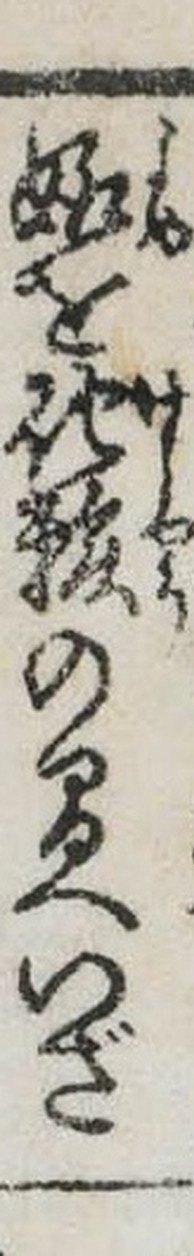娵を化粧の間へいざ
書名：頭書萬用婦人手紙之文言
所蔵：東京学芸大学教育コンテンツアーカイブ
